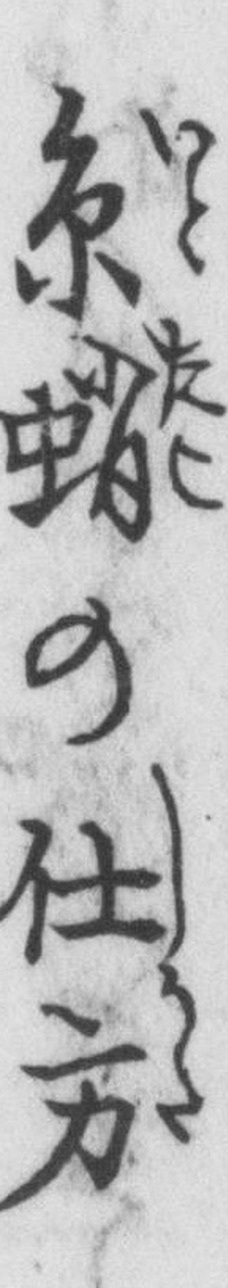糸蛸の仕方
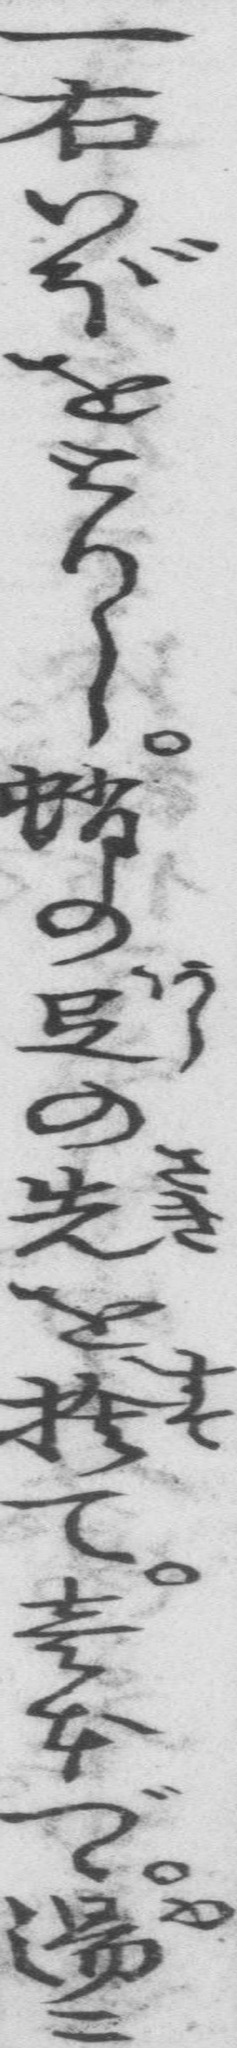一右いぼをとりし。蛸の足の先を捨て。壱本づゝ。湯に
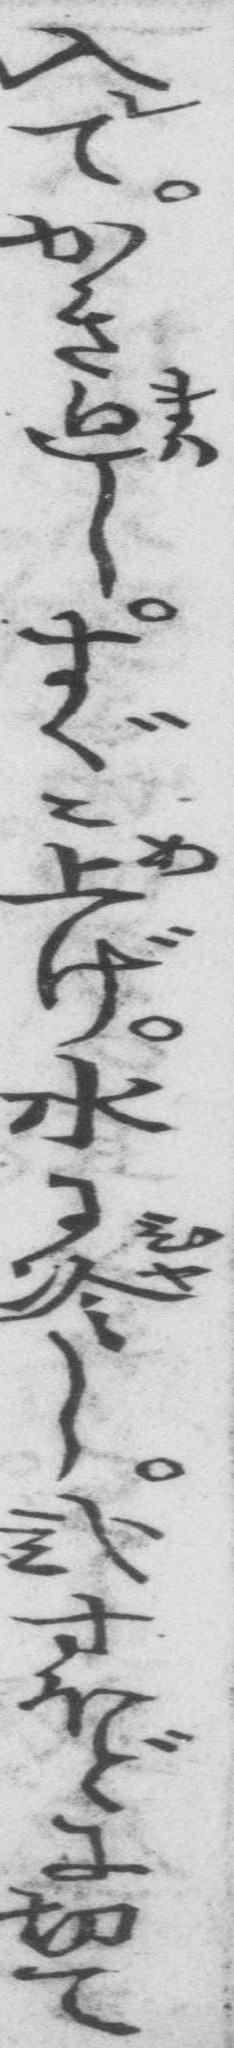入れて。かき廻し。すぐに上げ。水に冷し。弐寸ほどに切て
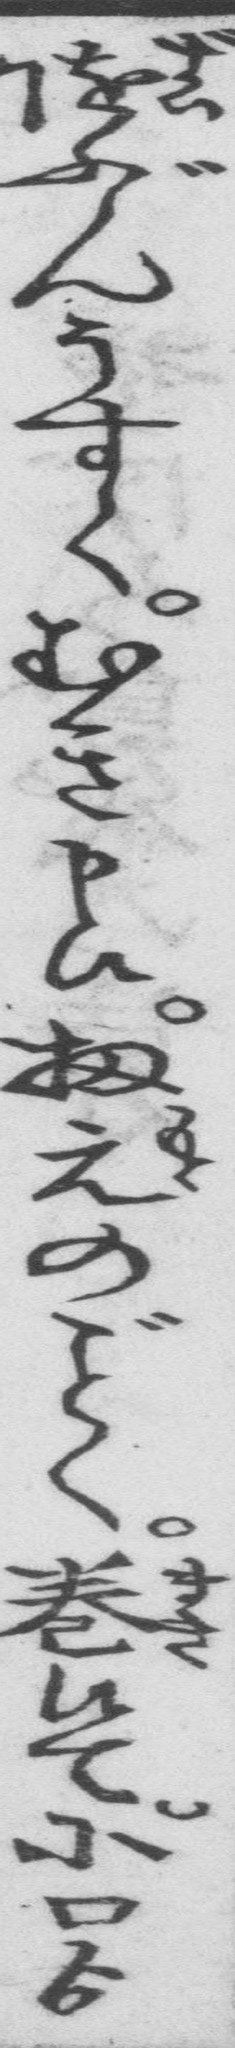随ぶんうすく。むき申候。扨元のごとく。巻候て。小口ゟ
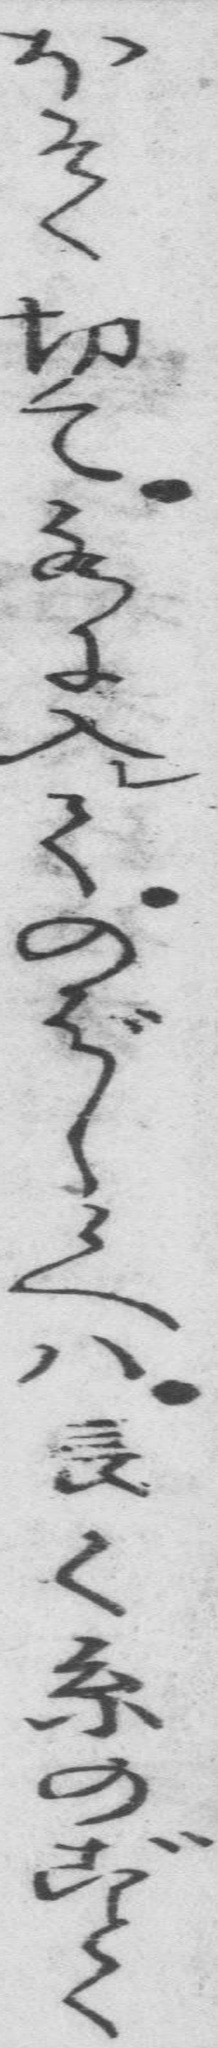ほそく切て。水に入れて。のばし候へは。長く糸のごとく
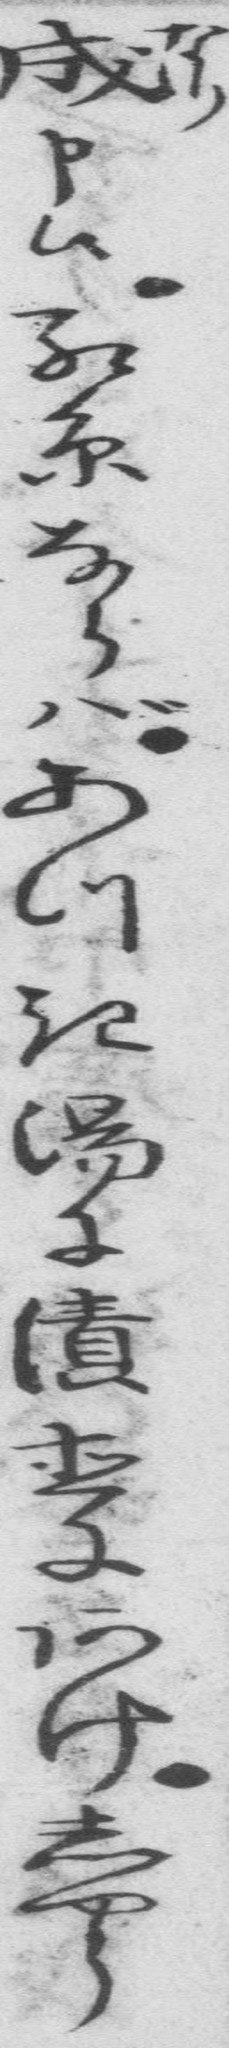成申候。紅糸ならば。あつき湯に漬直にあけ。しやう
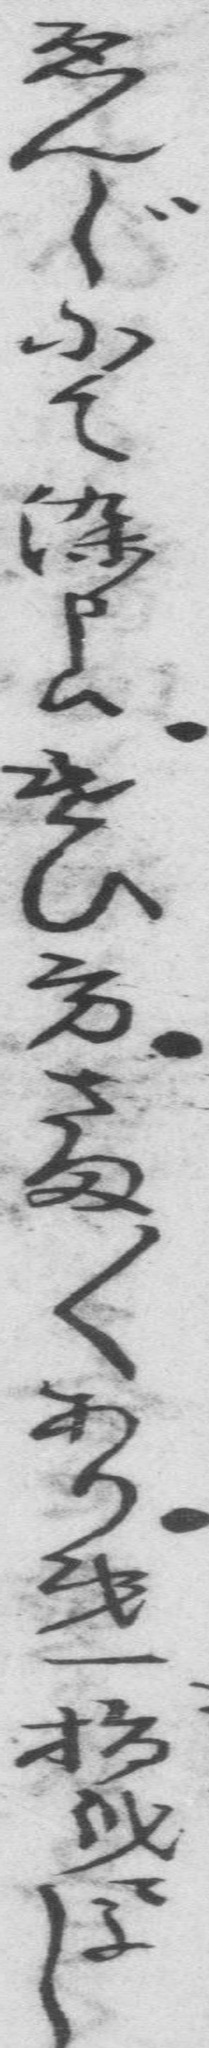ゑんじにて染申候。遣ひ方。さま〳〵あり。第一指身によし
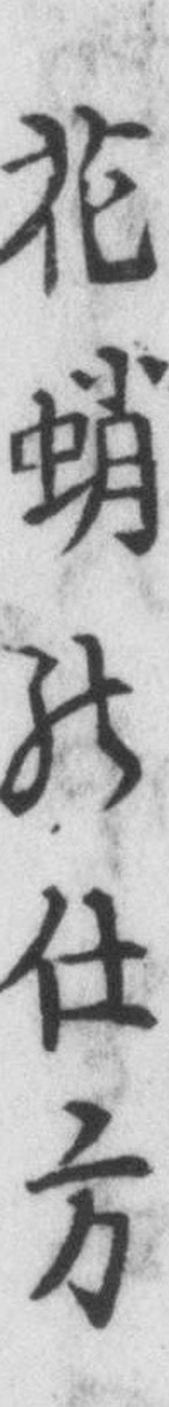花蛸の仕方
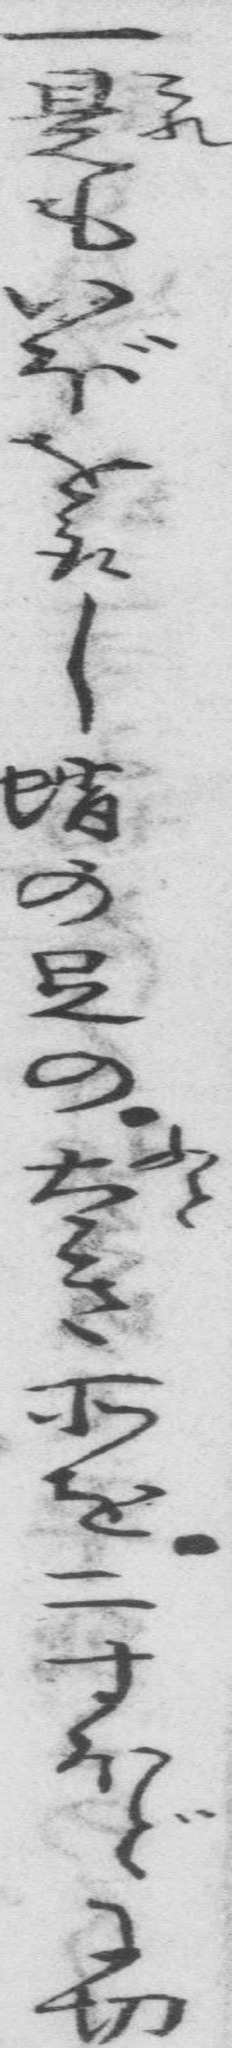一是もいぼを取し蛸の足の。太き所を。二寸ほどに切
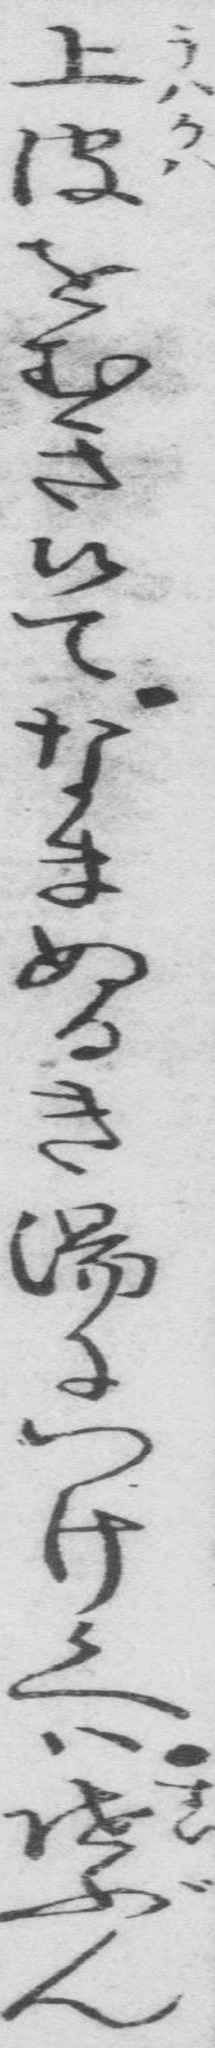上皮をむき候て。なまぬるき湯につけ候へは。随ぶん
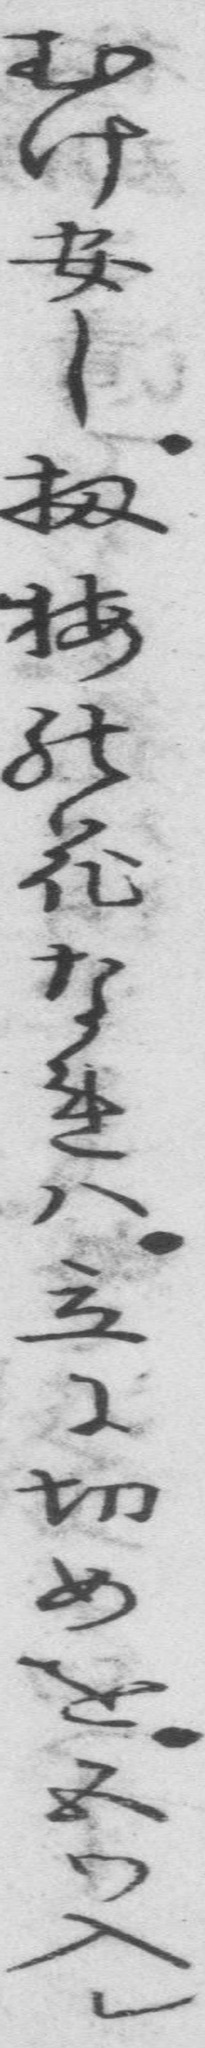むけ安し。扨梅の花なれは、立に切めを。五ツ入れ
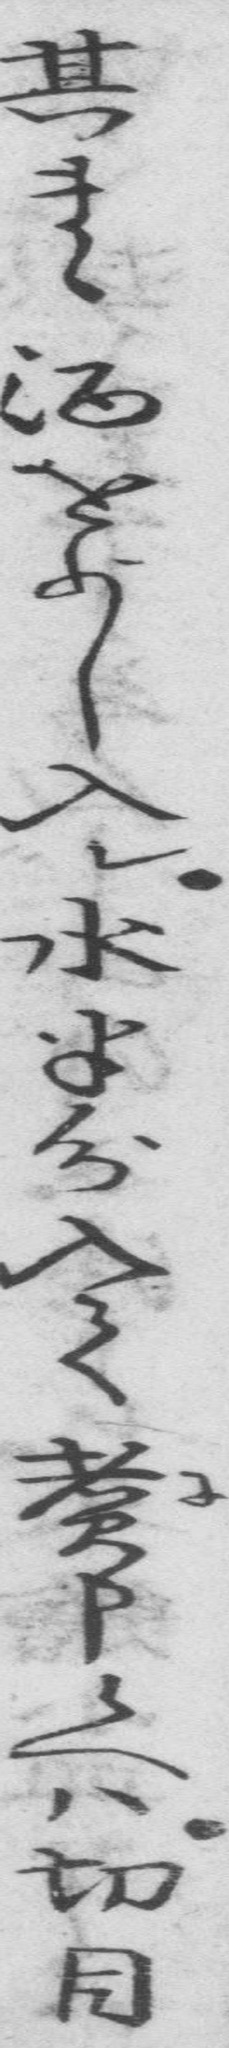其まゝ酒を少し入れ。水半分入て煮申候へは。切目
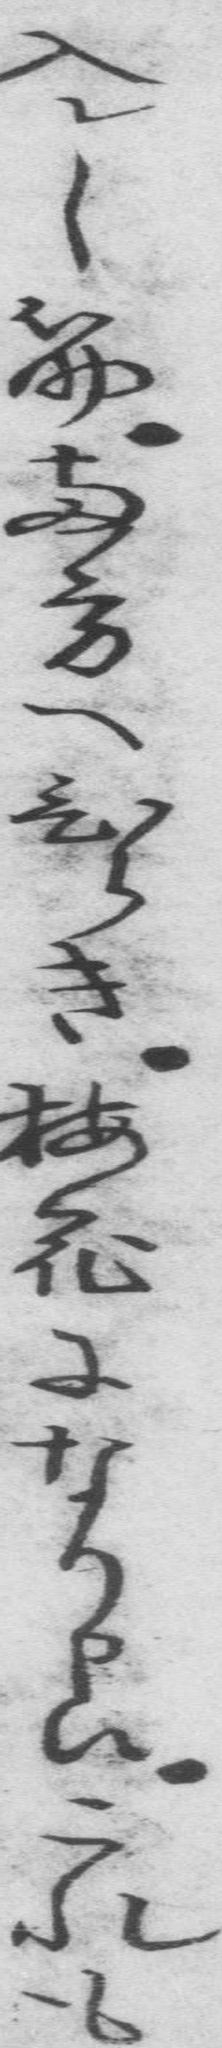入れし筋。両方へひらき。梅花になり申候。これも

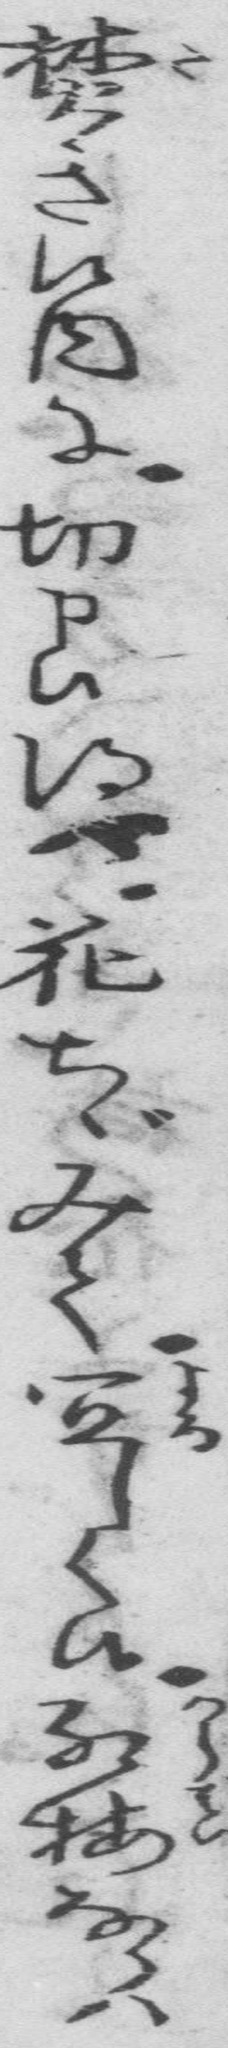焚き候内に。切申候得ば。花ちヾみて。宜しく候。紅梅ならは
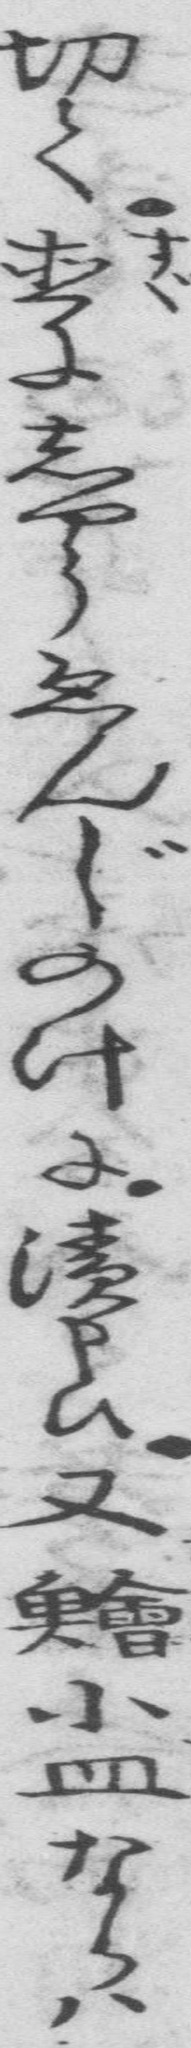切て。直にしやうゑんじの汁に。漬申候。又鱠小皿ならは
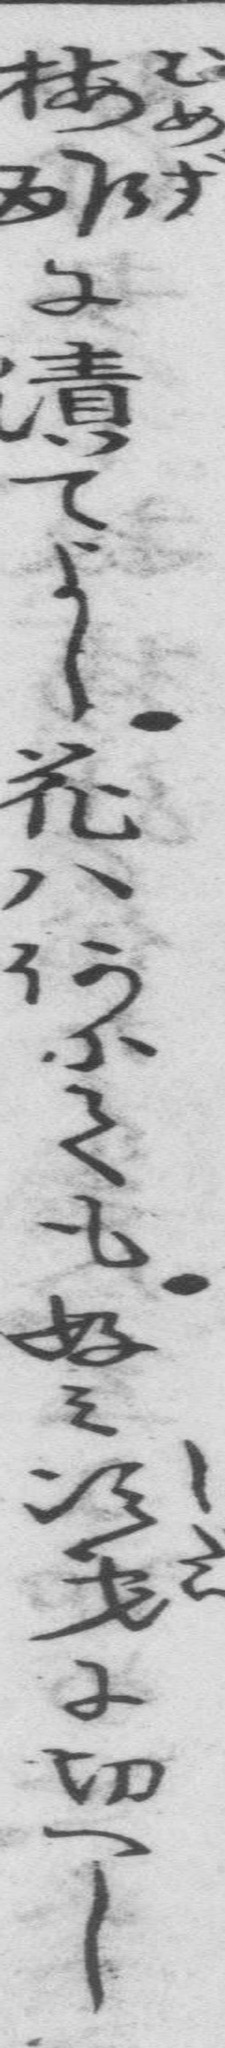梅酢に漬てよし。花は何にても。好み次第に切へし
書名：萬寳料理秘密箱
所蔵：大阪府立大学学術情報センター 国文学研究資料館
